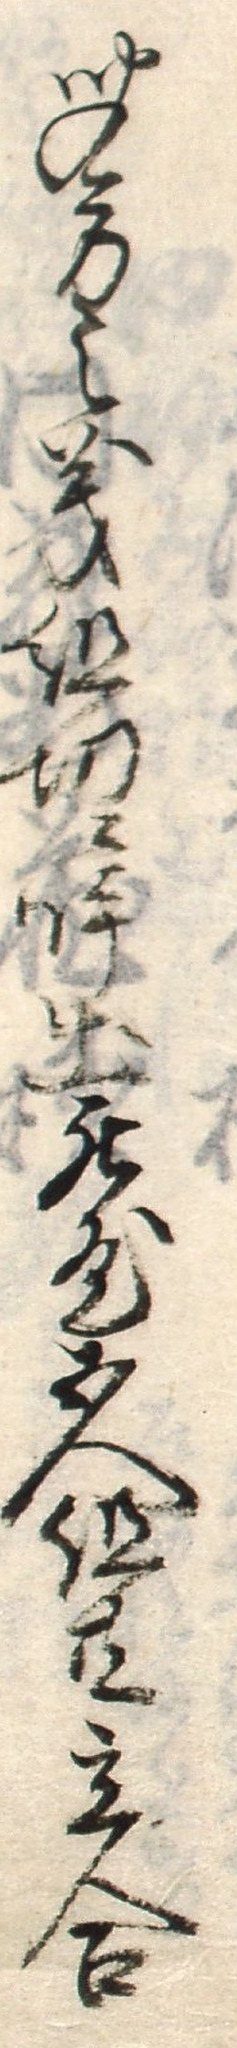聞方之義組切に呼出庄屋五人組共立合
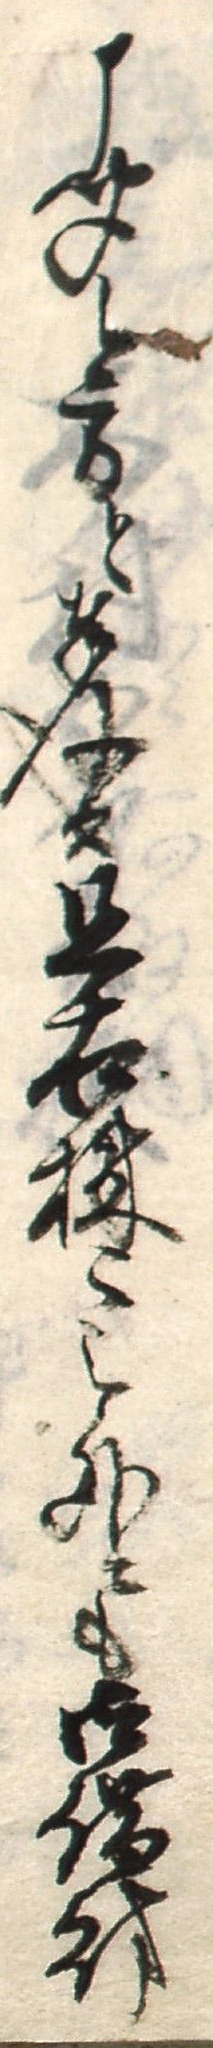申聞候方と奉存候且右株々之外にも御借財
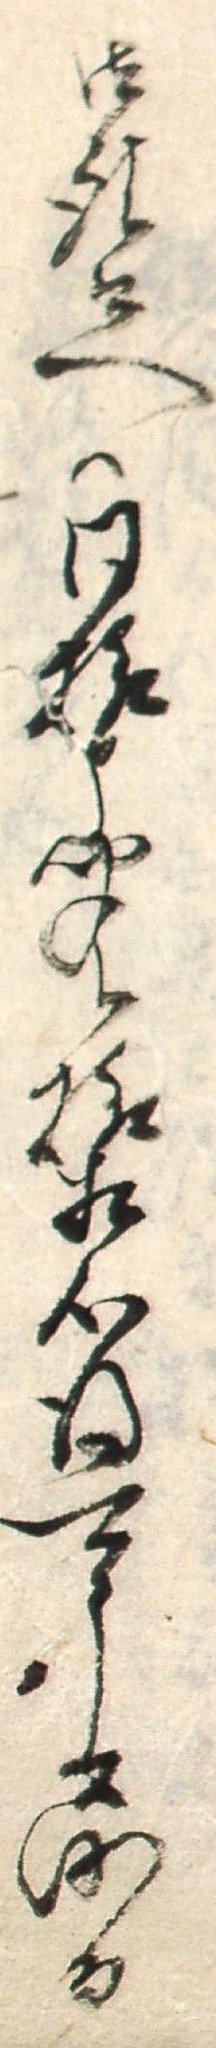御座候へは同様申聞候様相心得可申候仍而

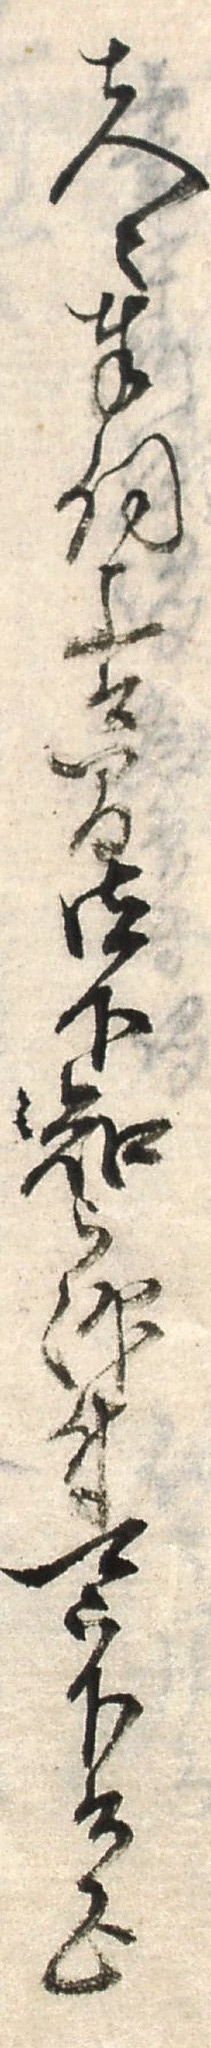夫々奉伺上候間御下知被仰付可被下候以上
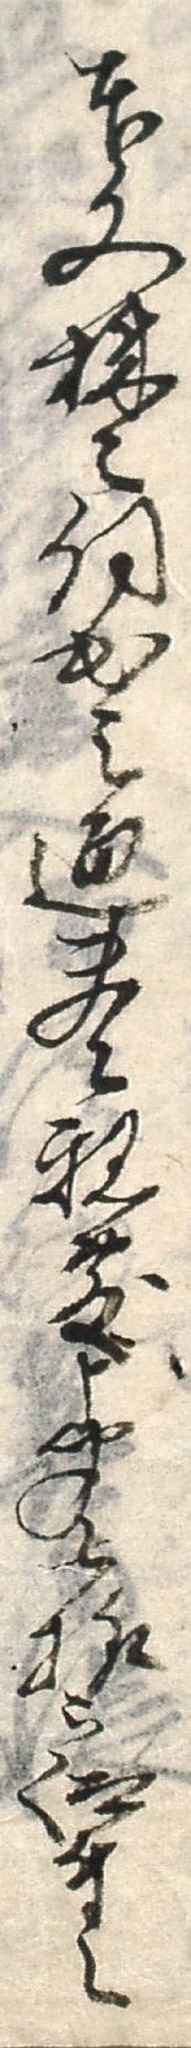本文株々伺出之通夫々親敷申聞候様被仰付候
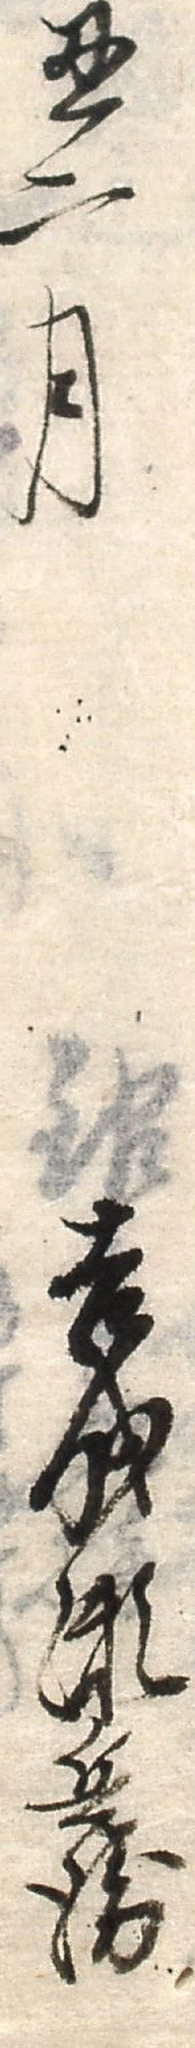丑二月吉成瀬兵衛
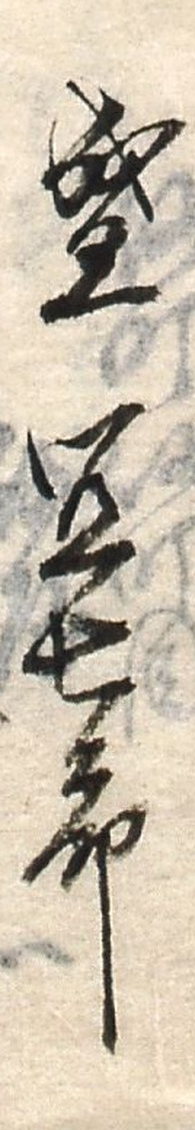盛宜七郎
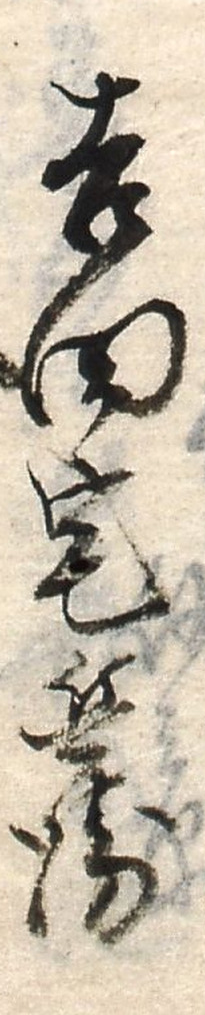吉田宅兵衛
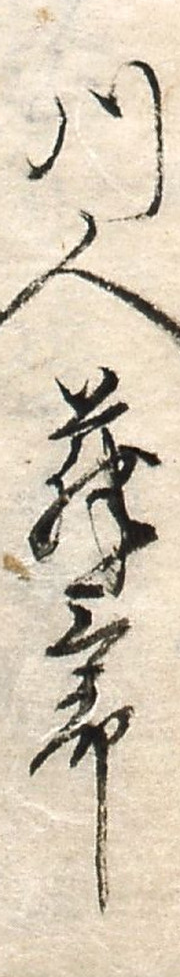川人藤三郎
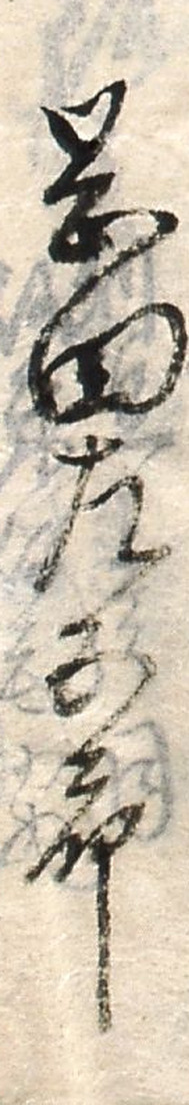岡田左五郎
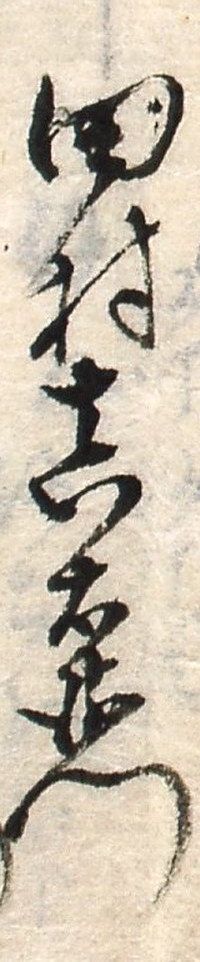田村真右衛門
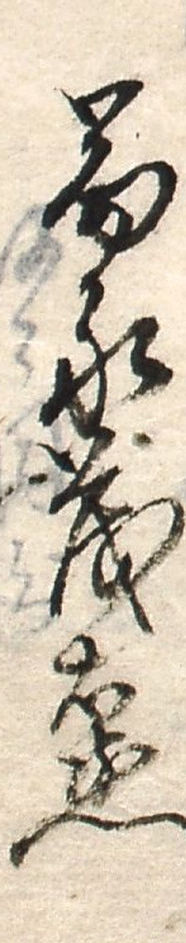富永茂右衛門
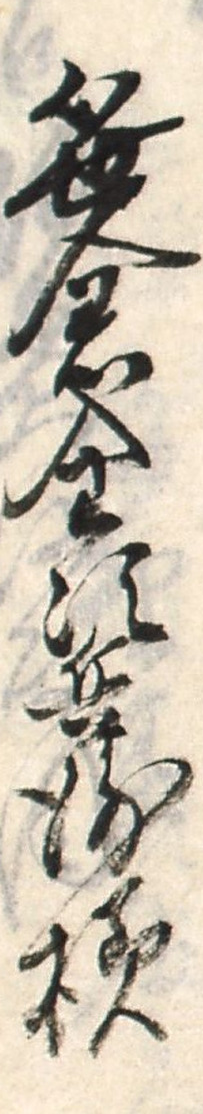笹倉金次兵衛様
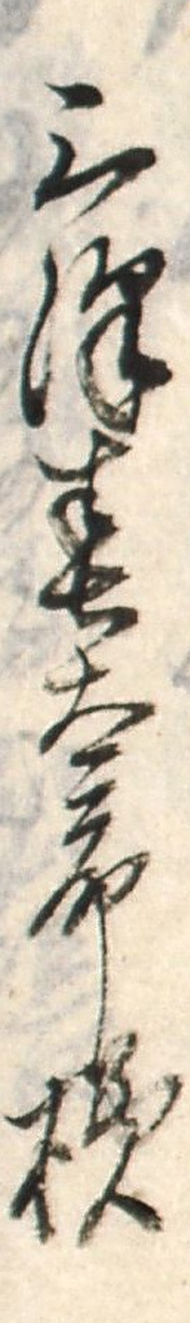三沢春太郎様
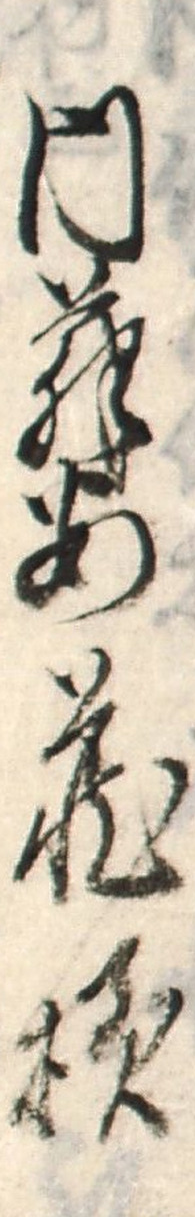門藤安蔵様
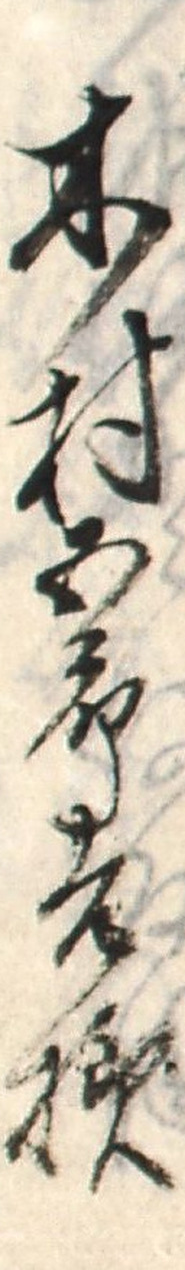木村五郎吉様
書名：御家中并無格御奉公人借銀御仕解一件御書付写其余共控
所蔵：鳴門教育大学 Naruto University of Education
